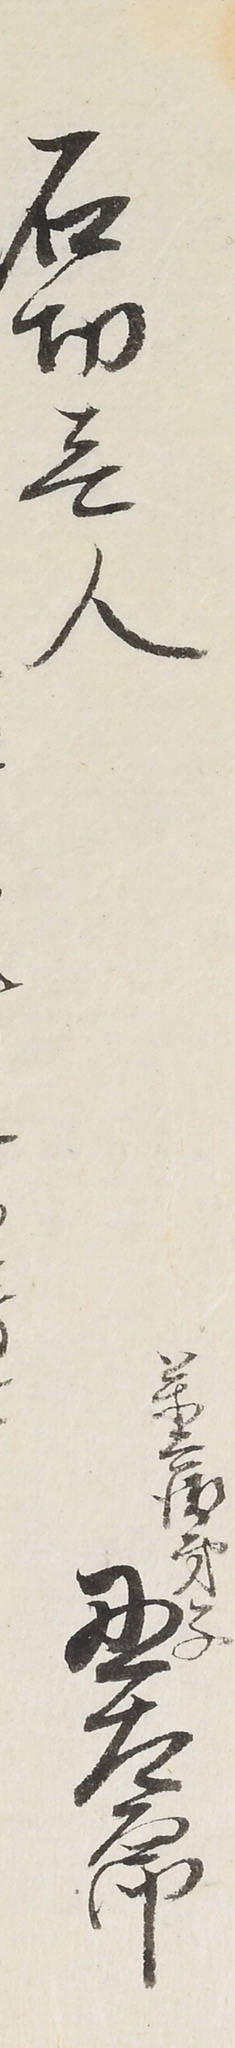一石切壱人善五郎
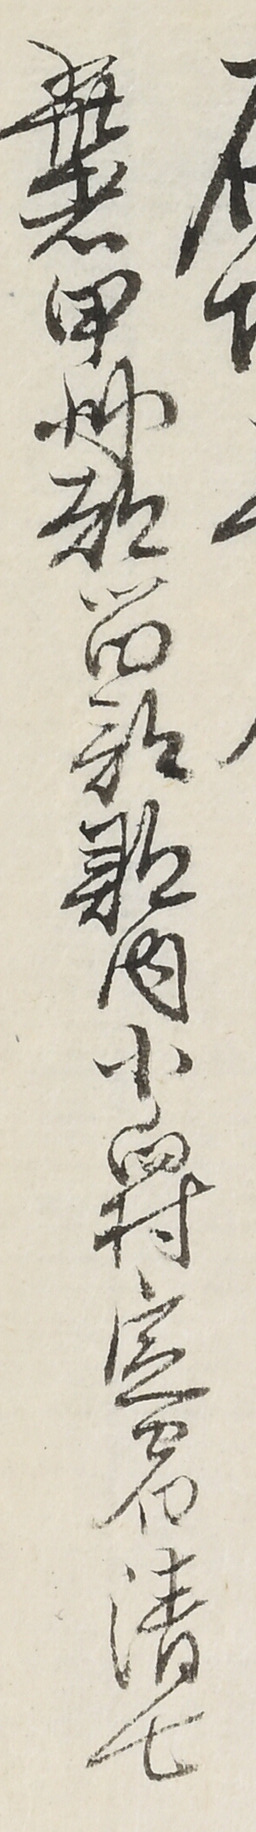此者甲州都留郡郡内小向村定宿清七
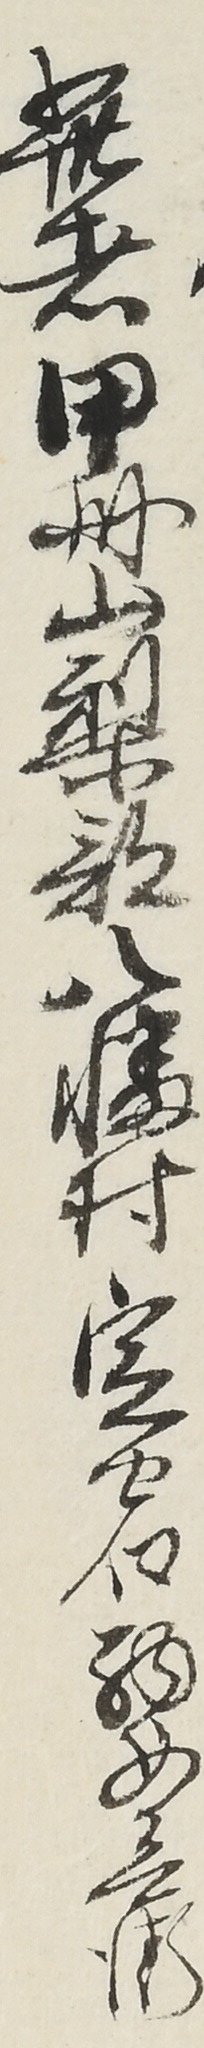此者甲州山梨郡八幡村定宿要兵衛

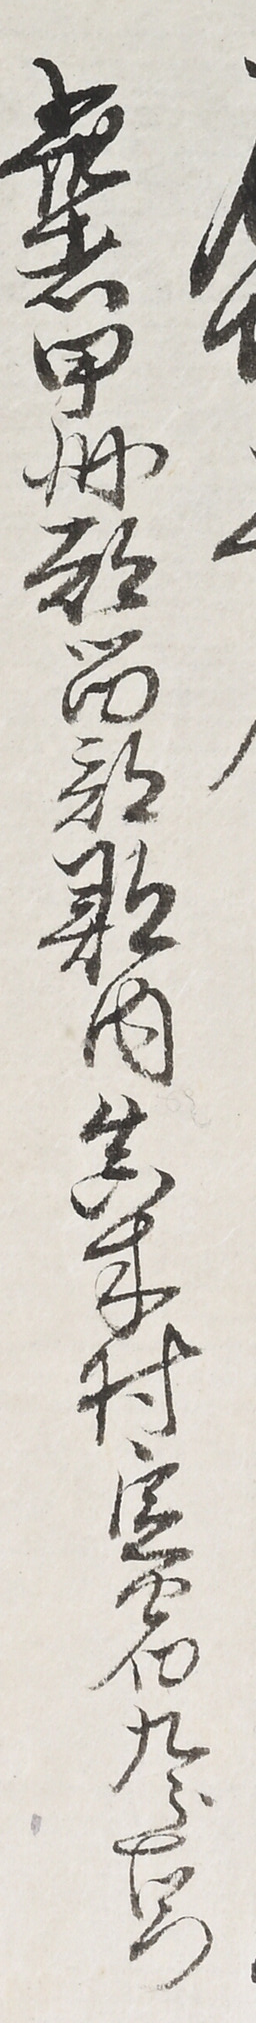此者甲州都留郡郡内真木村定宿九郎右衛門
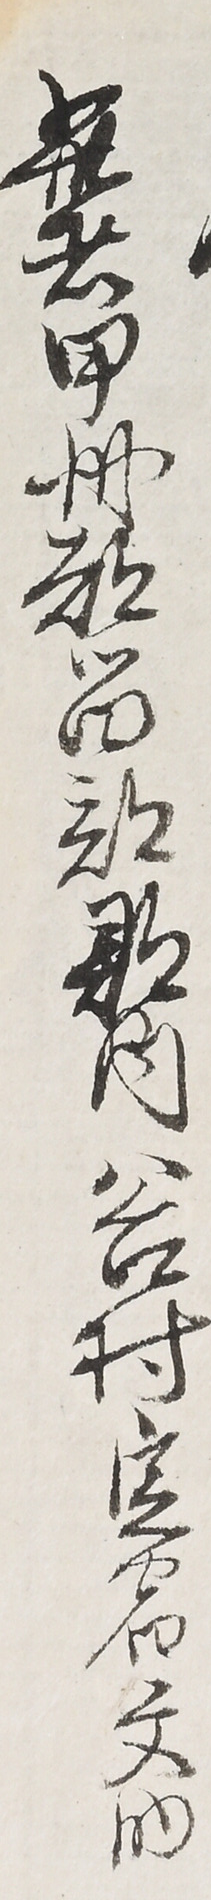此者甲州都留郡郡内谷村定宿文助
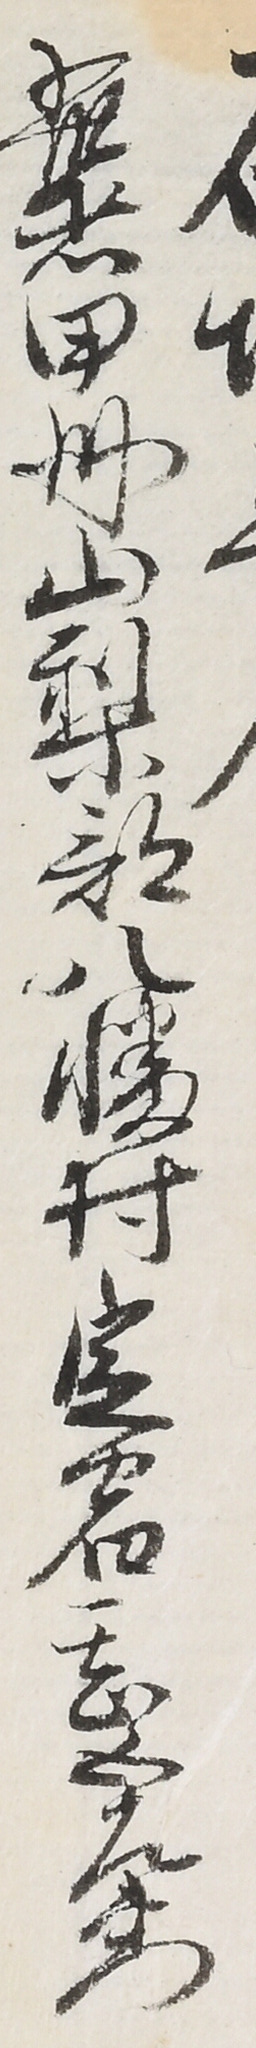此者甲州山梨郡八幡村定宿甚五左衛門
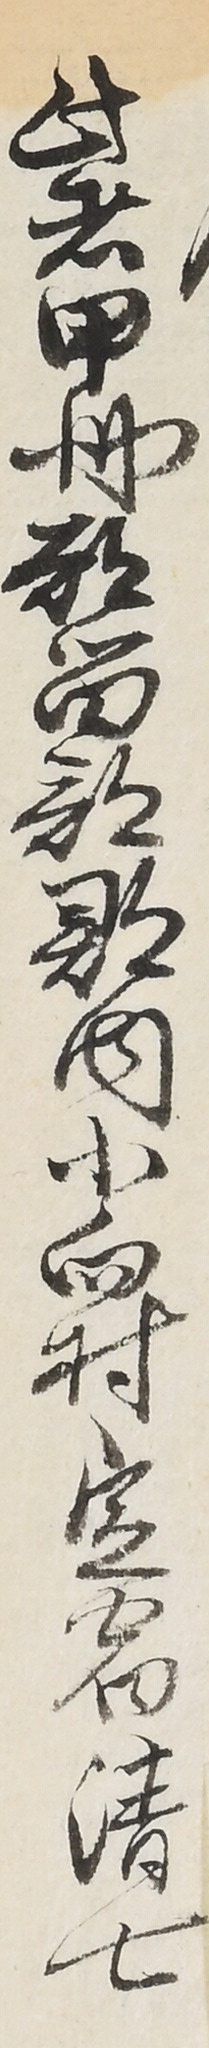此者甲州都留郡郡内小向村定宿清七
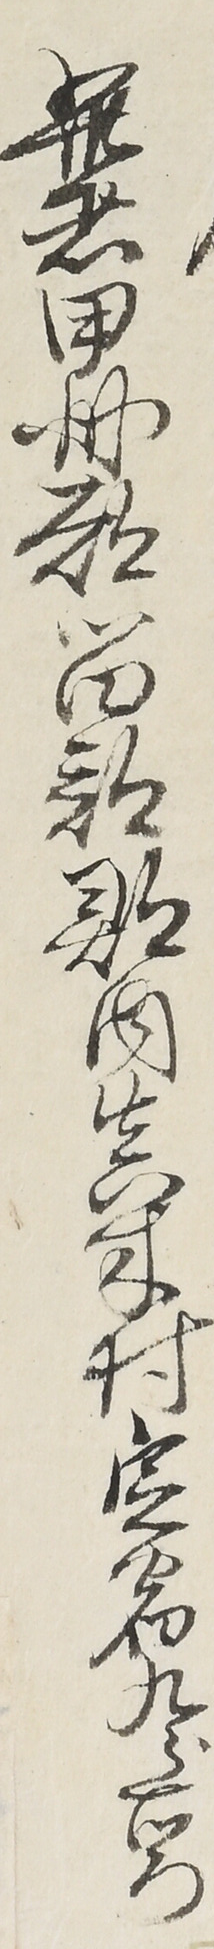此者甲州都留郡郡内真木村定宿九郎右衛門
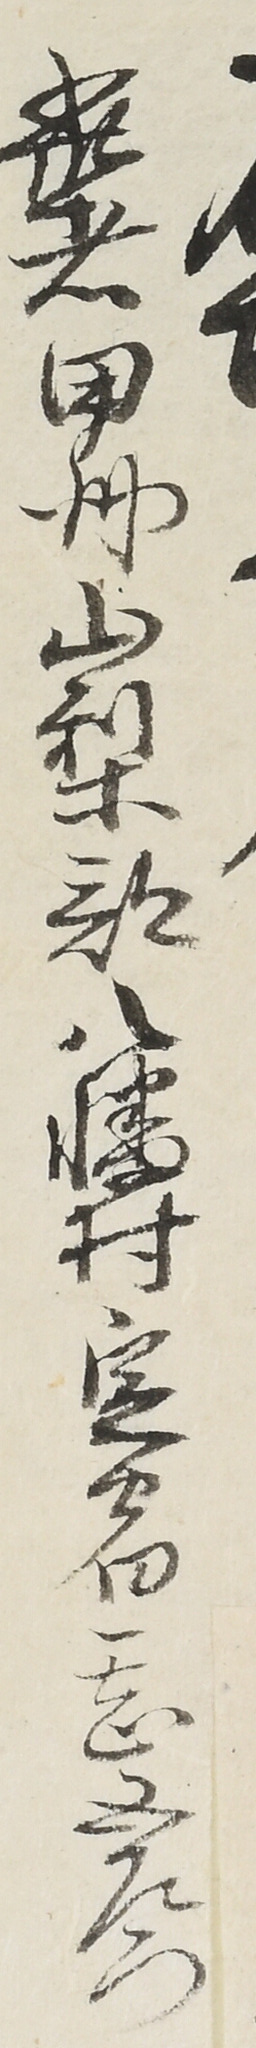此者甲州山梨郡八幡村定宿甚五左衛門

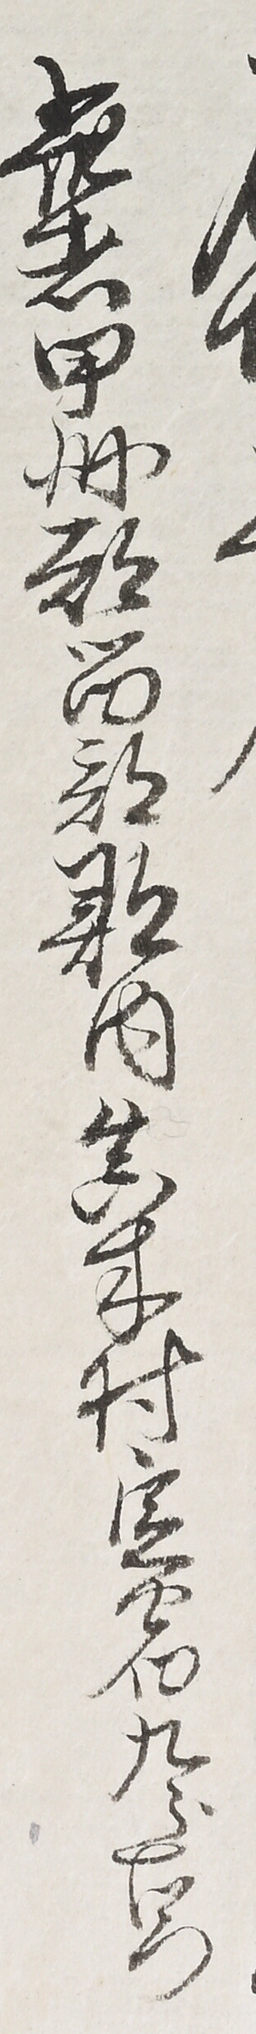此者甲州都留郡郡内真木村定宿九郎右衛門
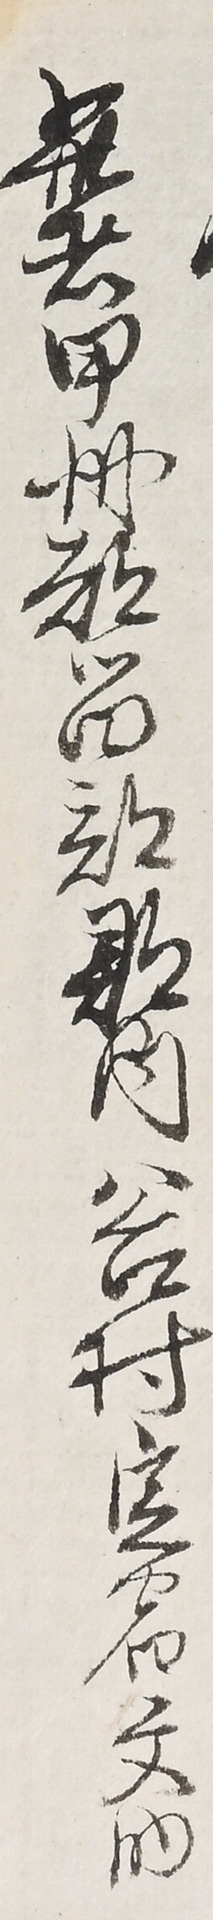此者甲州都留郡郡内谷村定宿文助
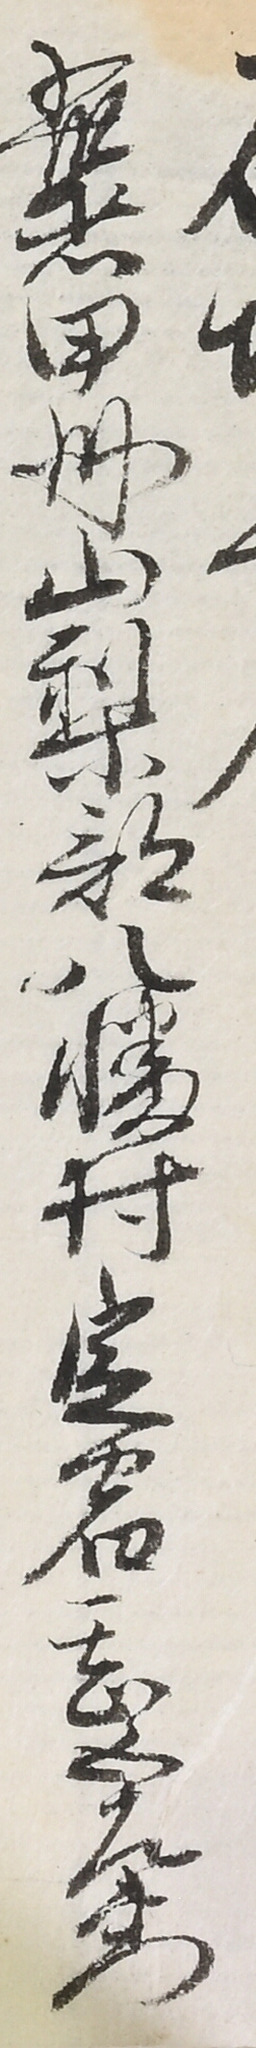此者甲州山梨郡八幡村定宿甚五左衛門
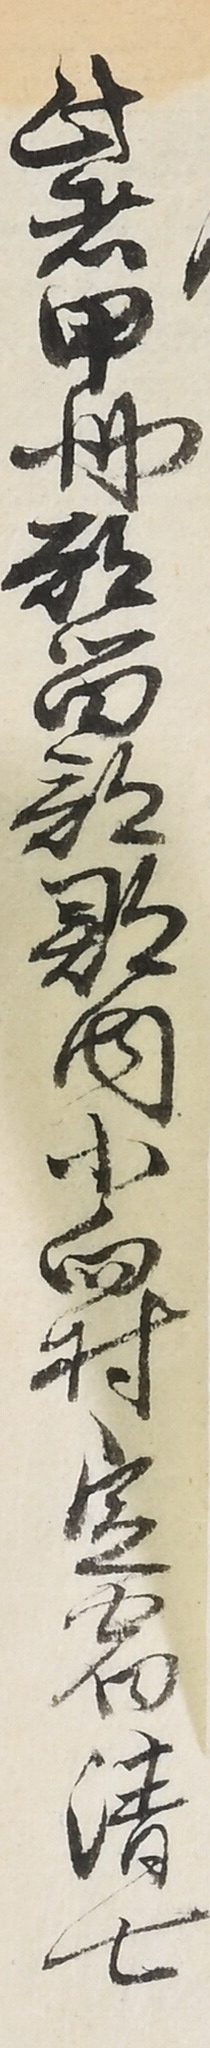此者甲州都留郡郡内小向村定宿清七
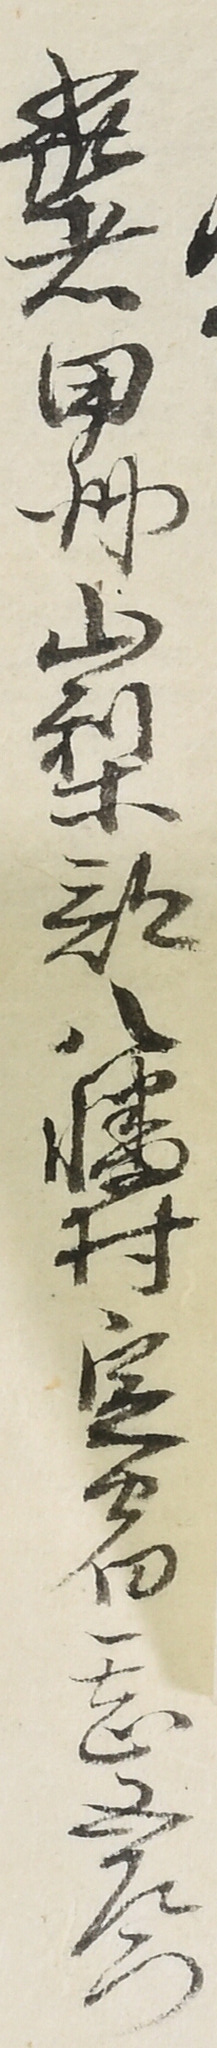此者甲州山梨郡八幡村定宿甚五左衛門

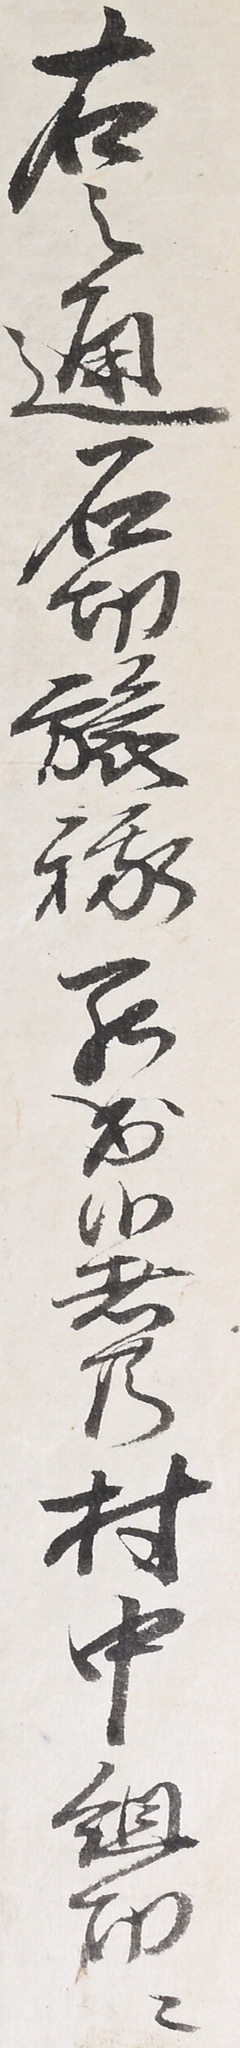右之通石切旅稼罷出候者共村中組切ニ
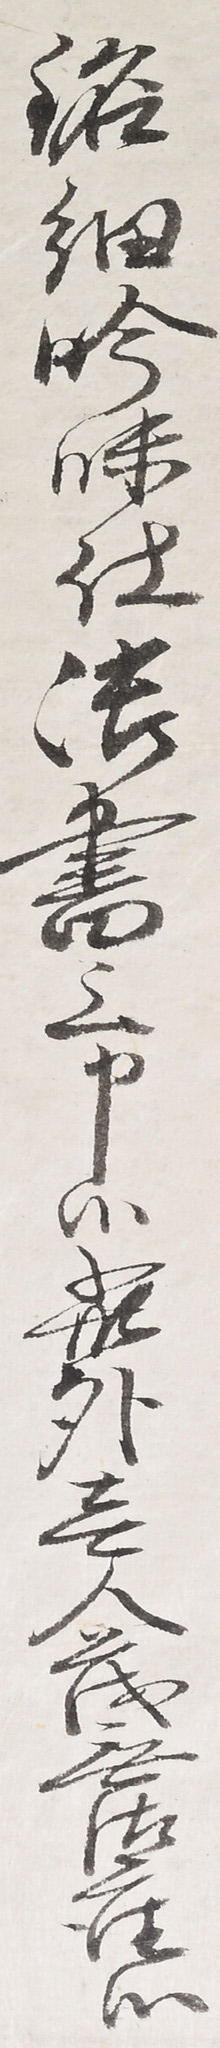銘細吟味仕御書上申候此外壱人も無御座候
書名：嘉永五壬子年二月他國出石切名前書上帳
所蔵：伊那市立高遠町図書館・合同会社AMANE
